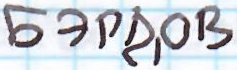бэрдов
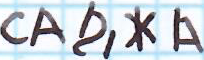саджа
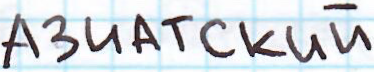азиатский
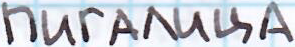пигалица
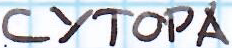сутора
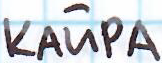кайра
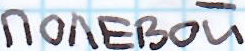полевой
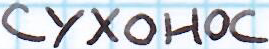сухонос
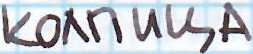колпица
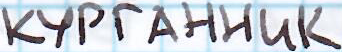курганник
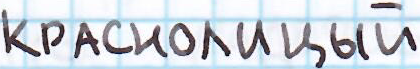краснолицый
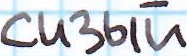сизый
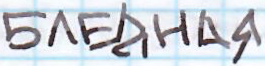бледная
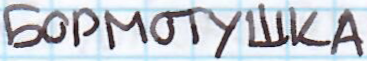бормотушка
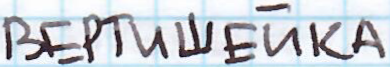вертишейка
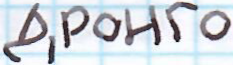дронго
